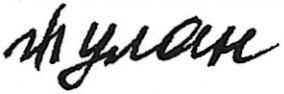жулан
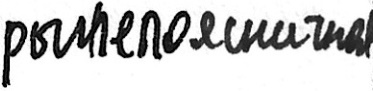рыжепоясничная
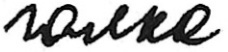галка
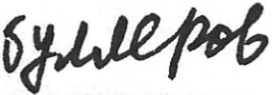буллеров
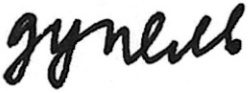дупель
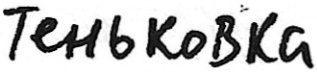теньковка
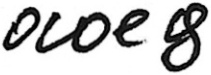осоед
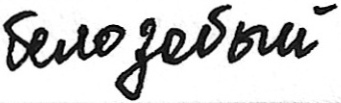белозобый
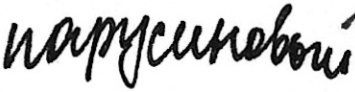парусиновый
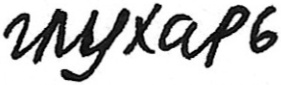глухарь
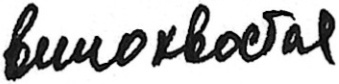вилохвостая
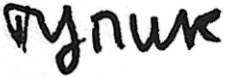тупик
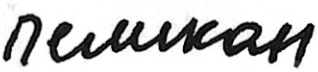пеликан
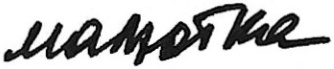малютка
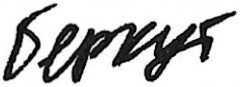беркут
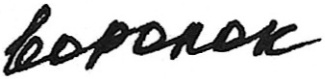воронок
